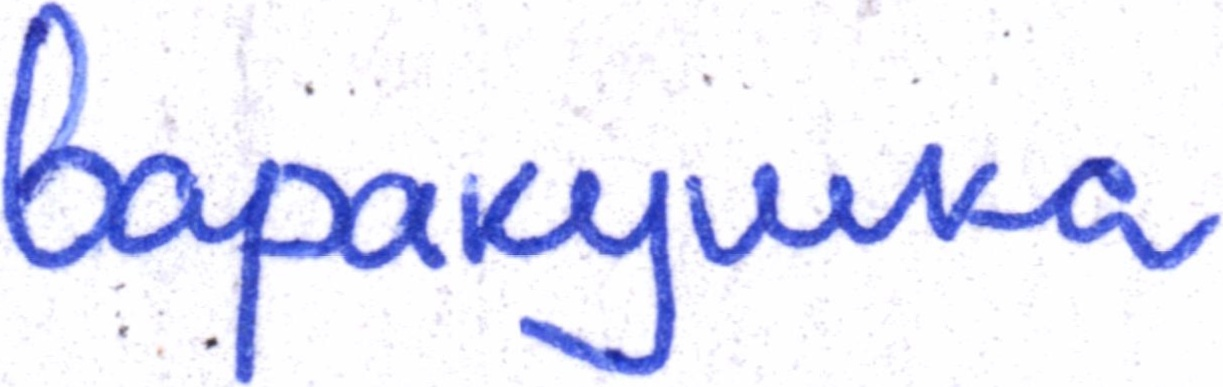варакушка
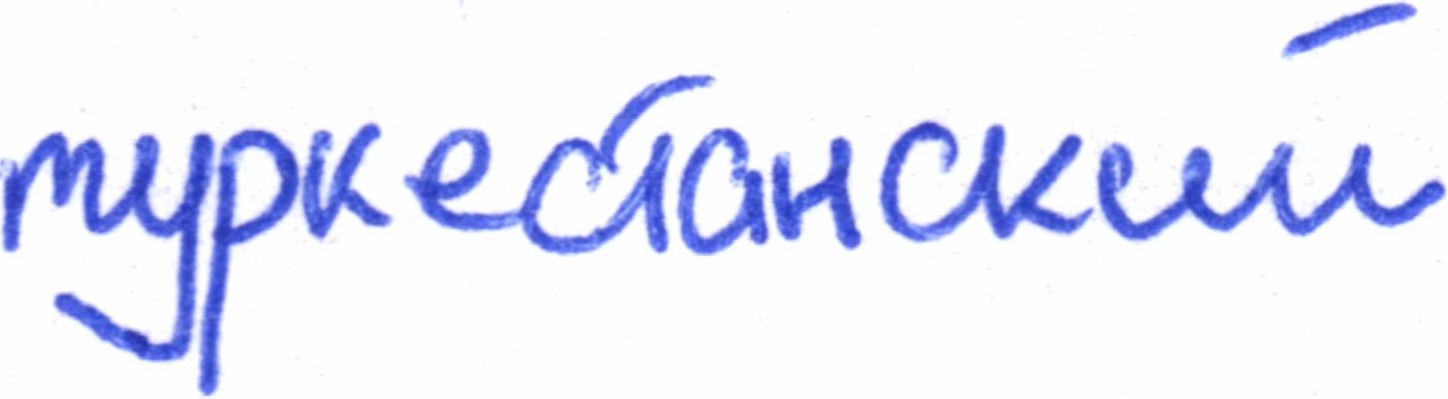туркестанский
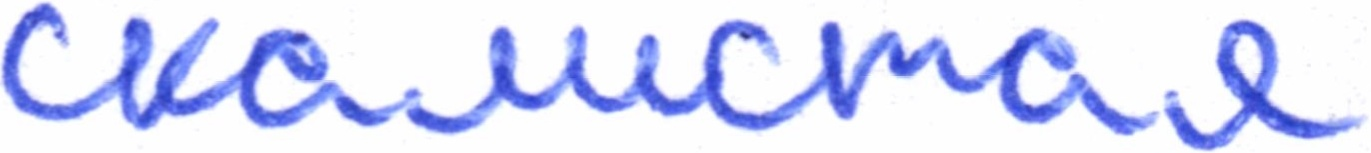скалистая
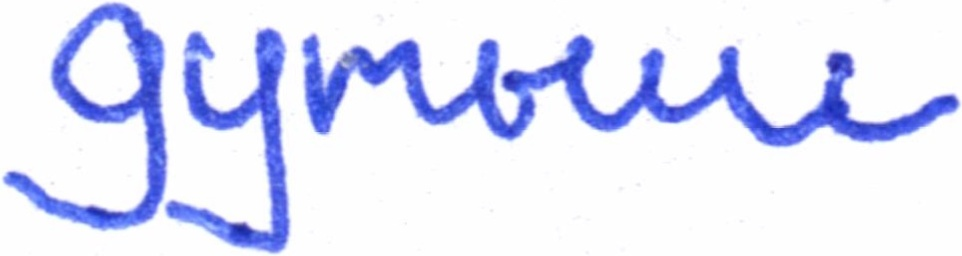дутыш
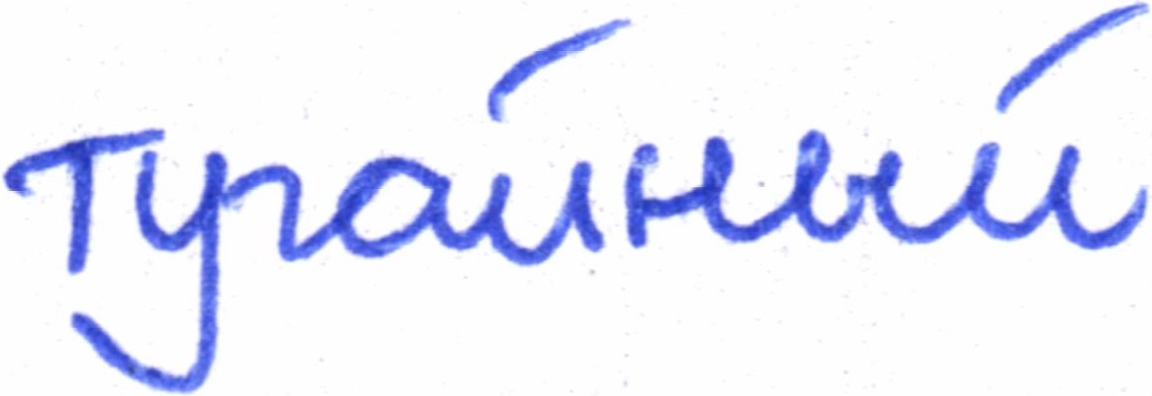тугайный
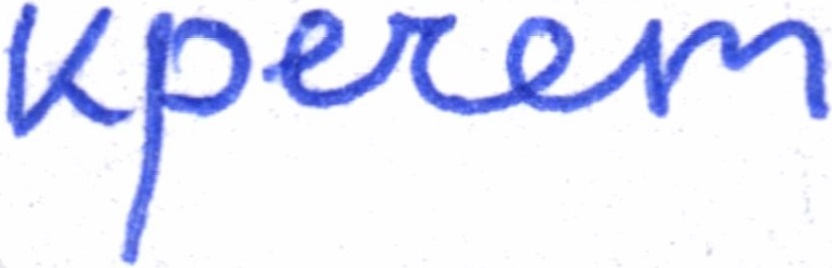кречет
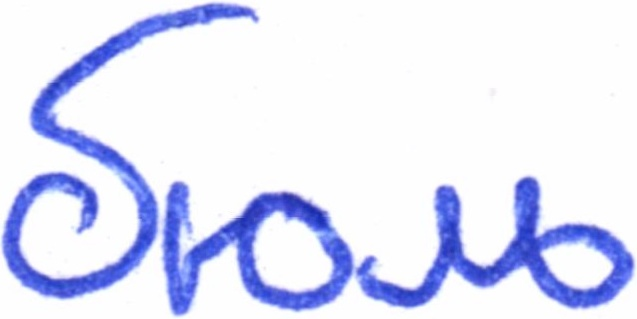бюль
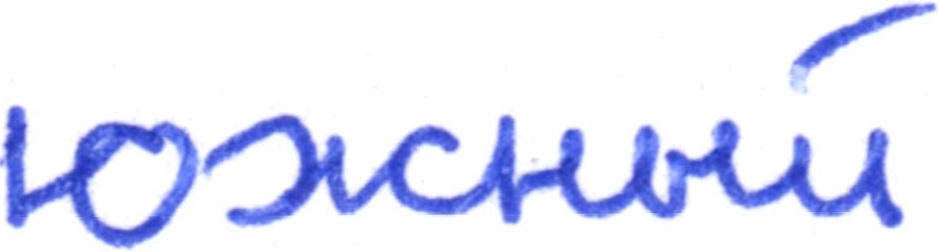южный
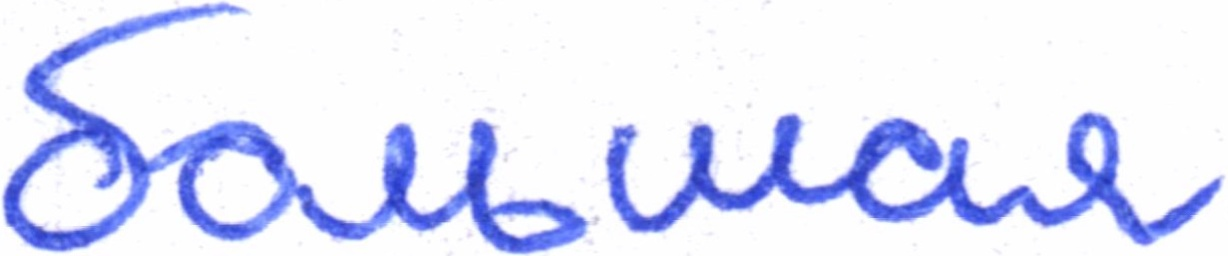большая
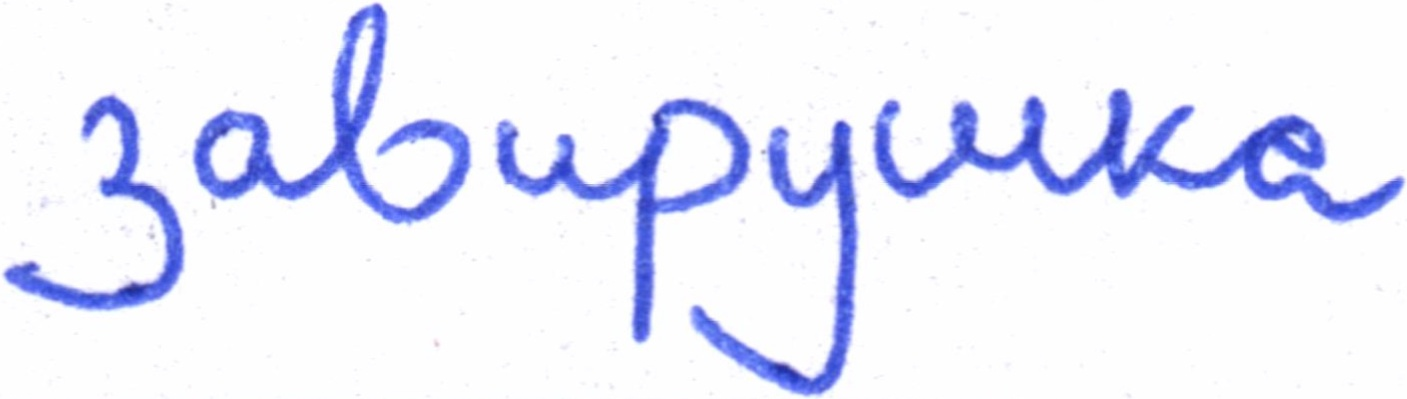завирушка
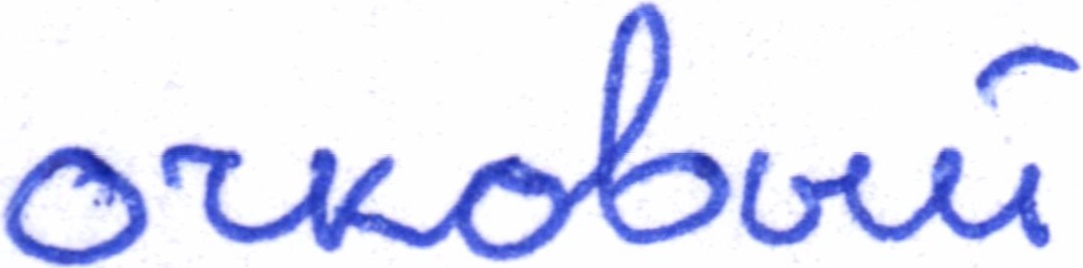очковый
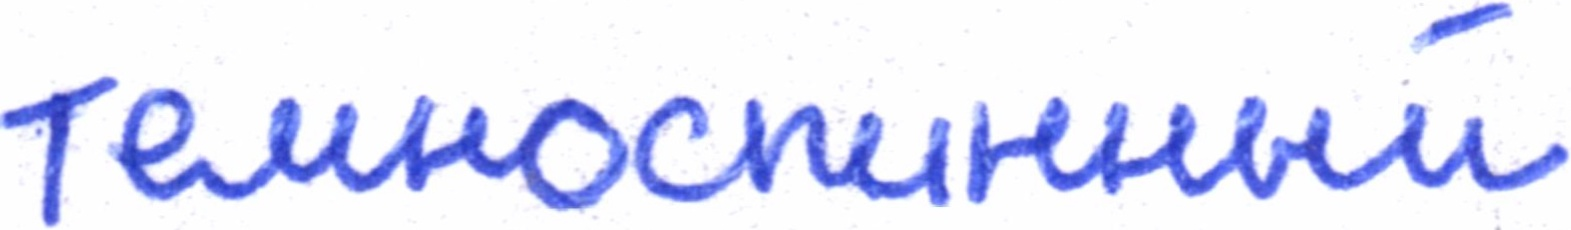темноспинный
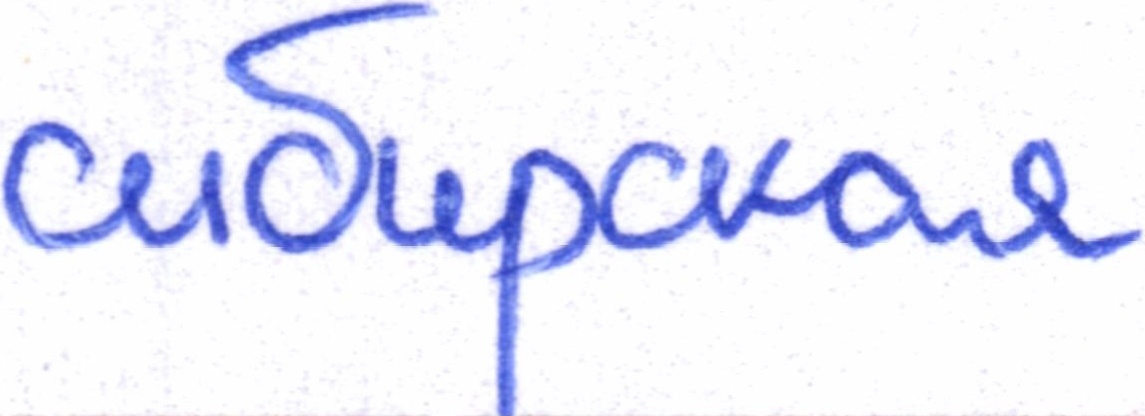сибирская
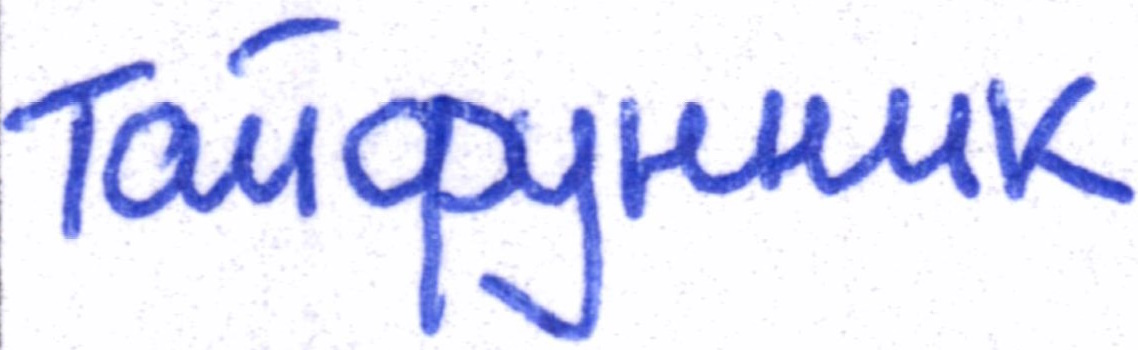тайфунник
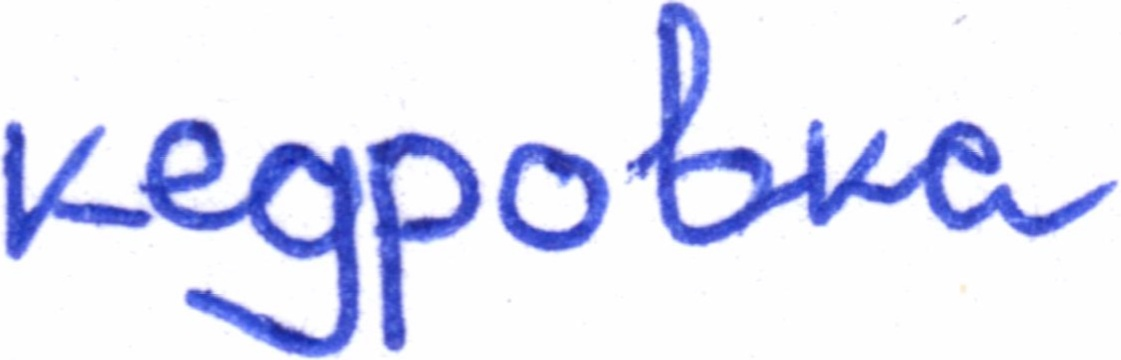кедровка
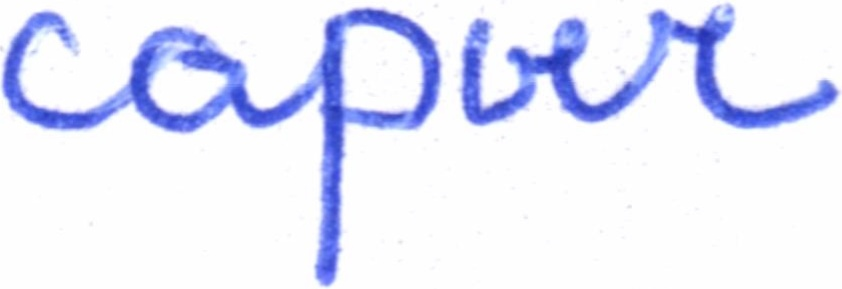сарыч
